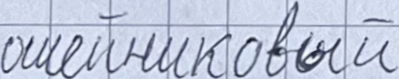ошейниковый
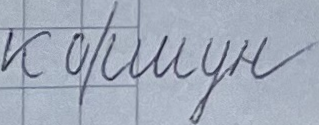коршун
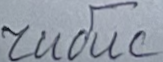чибис
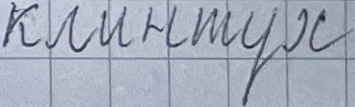клинтух
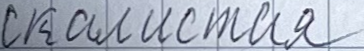скалистая
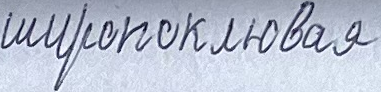широпоклювая
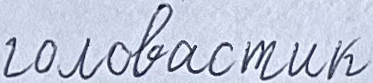головастик
